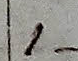1
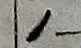1
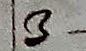3
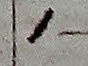1
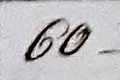60
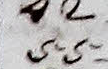55
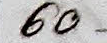60
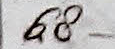68
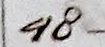48
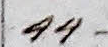44
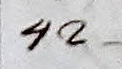42
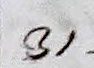31
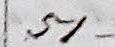51
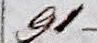91
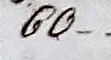60
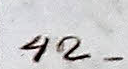42
